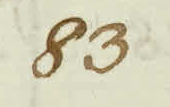83
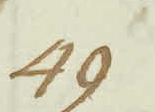49
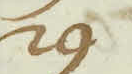29
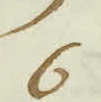6
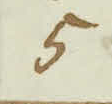5
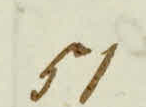51
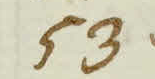53
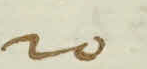20
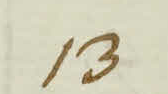13
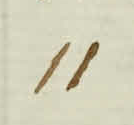11
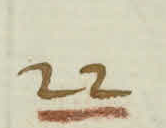22
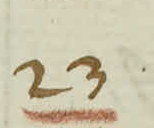23
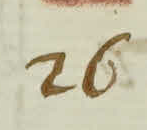26
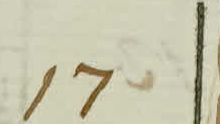17
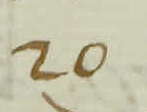20
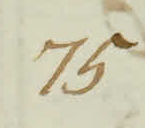75
